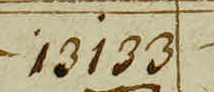13133
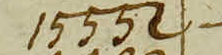15552
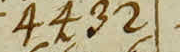4432
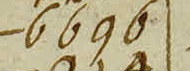6696
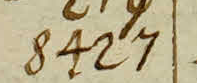8427
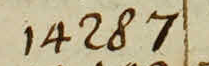14287
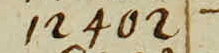12402
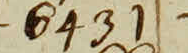6431
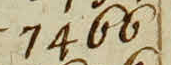7466
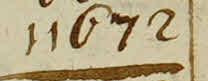11672
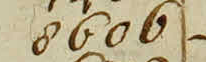8606
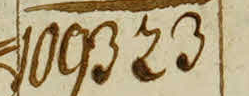109323
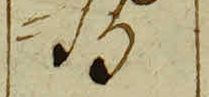15
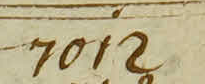7012
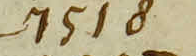7518
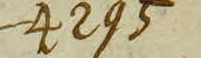4295
